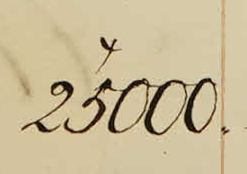25000
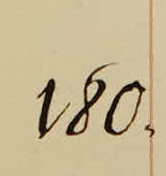180
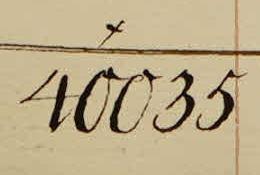40035
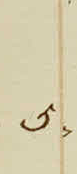5
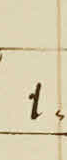1
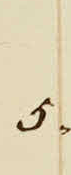5
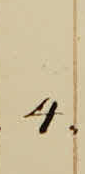4
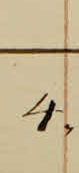4
